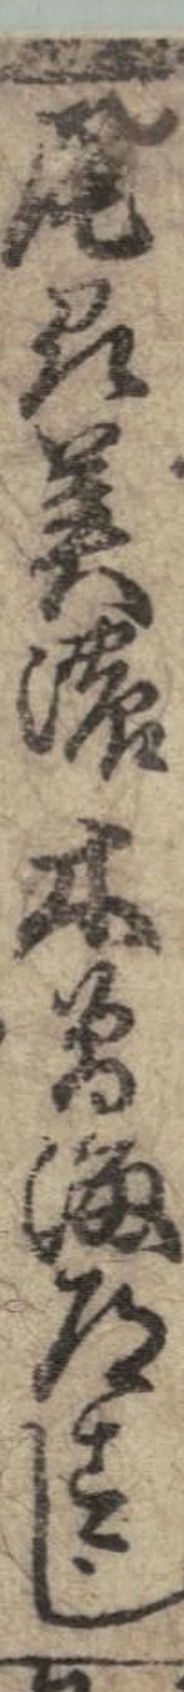尾州美濃木曽海道すこし
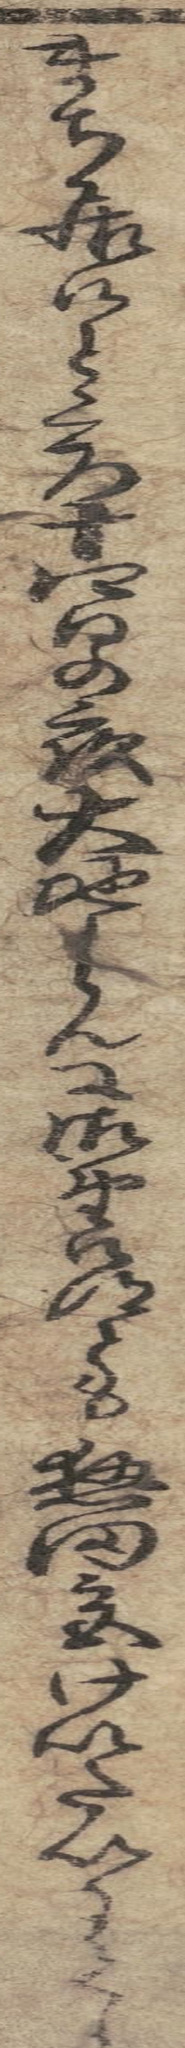まち居候ところ十四日の夜大地しんに御座候得とも熱田宮けいたいにては
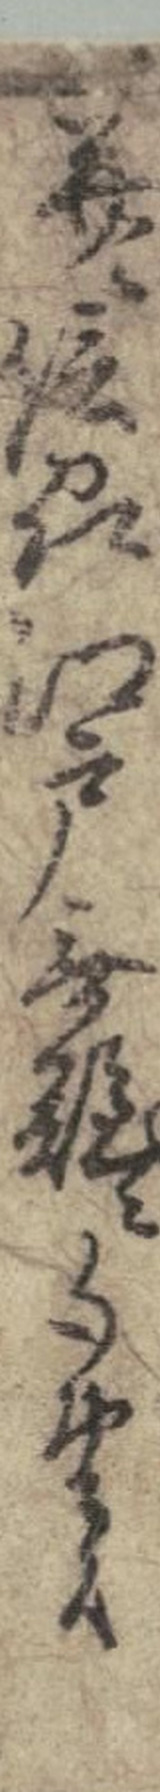幷に信州江戸無難に御座候
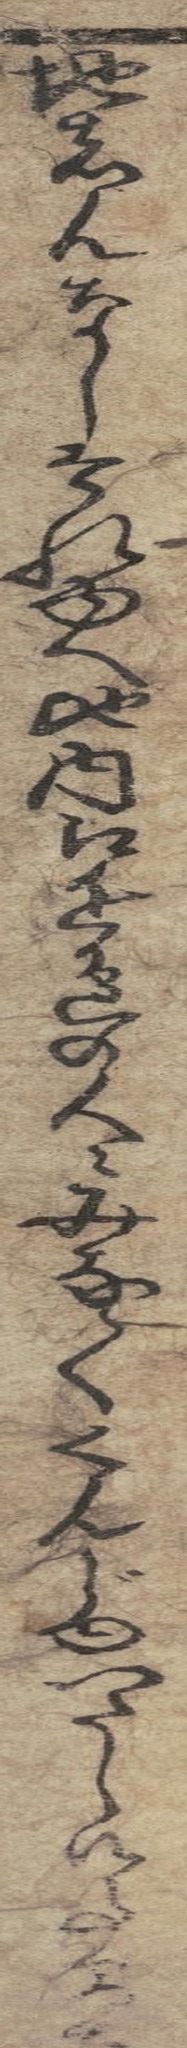地しんなりそれゆへ地内え近辺の人〻みな〳〵くんじゆいたし候事今有
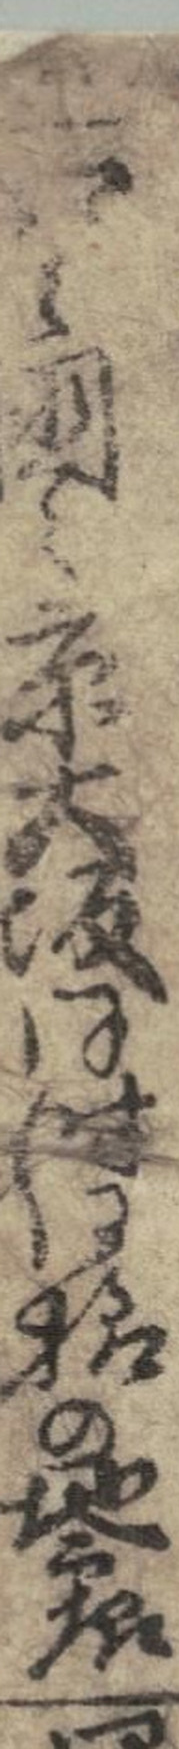右之国〻京大坂同時同様の地震
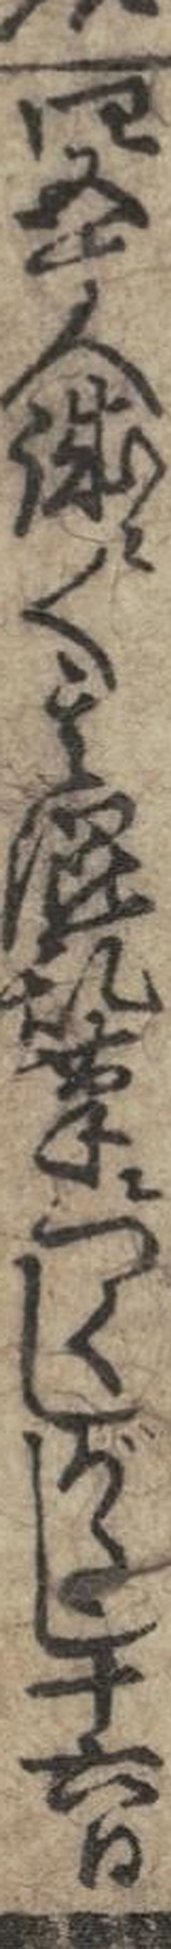四五十人誠に〳〵其混乱筆につくしかたし十六日
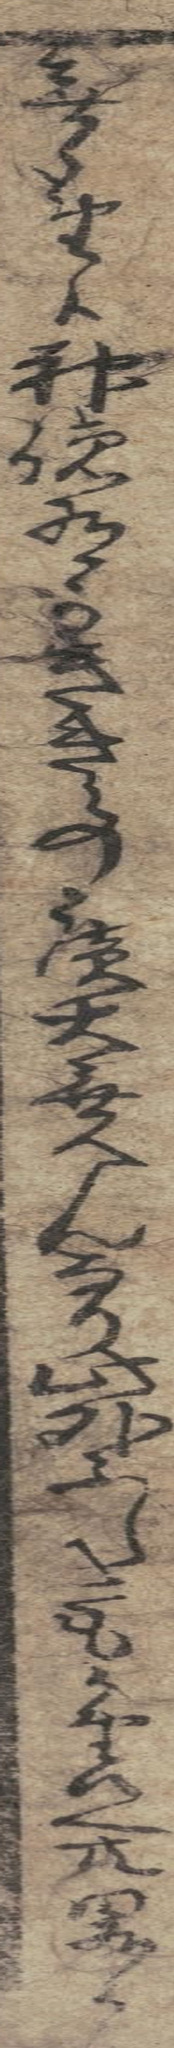無御座候神徳有かきき事に広大無へんなり此外ふしきも御座候へ共略書
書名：聞書　諸國大地震并ニ出火・早飛脚廻りにてくわしき所本しらべ　大地震・山城勢州大和三河江州越前　聞書　大地震並ニ出火の次第
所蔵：東京大学地震研究所図書室 Earthquake Research Institute Library, The University of Tokyo, JAPAN
